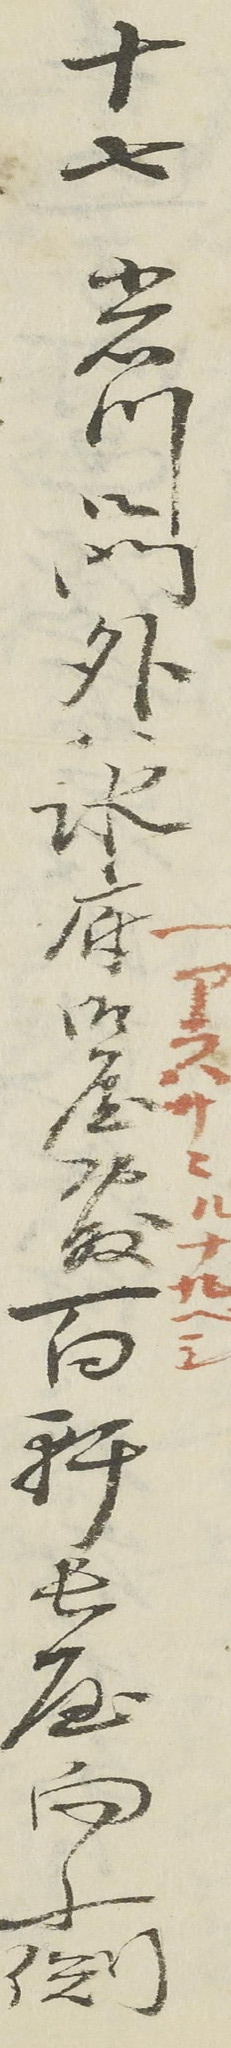十七小石川御門外ハ水府御屋敷百軒長屋向不倒
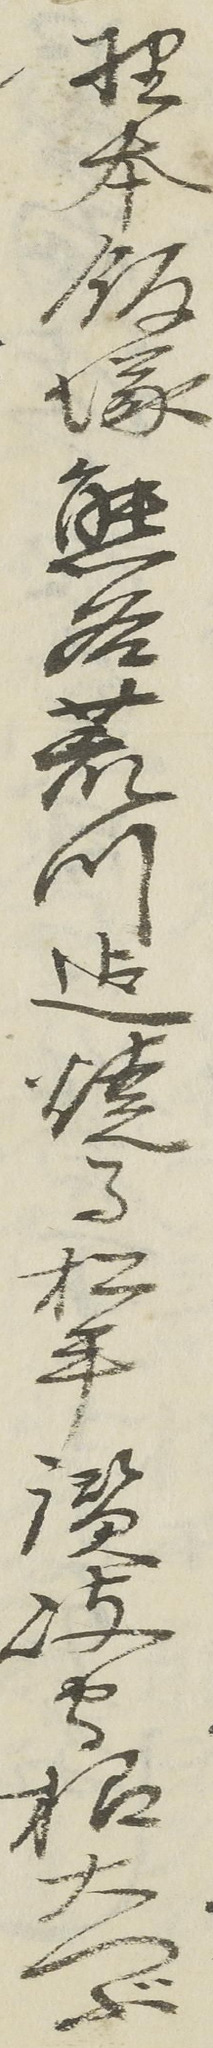野本飯塚熊谷荒川迄焼る松平讃岐守様大つぶ
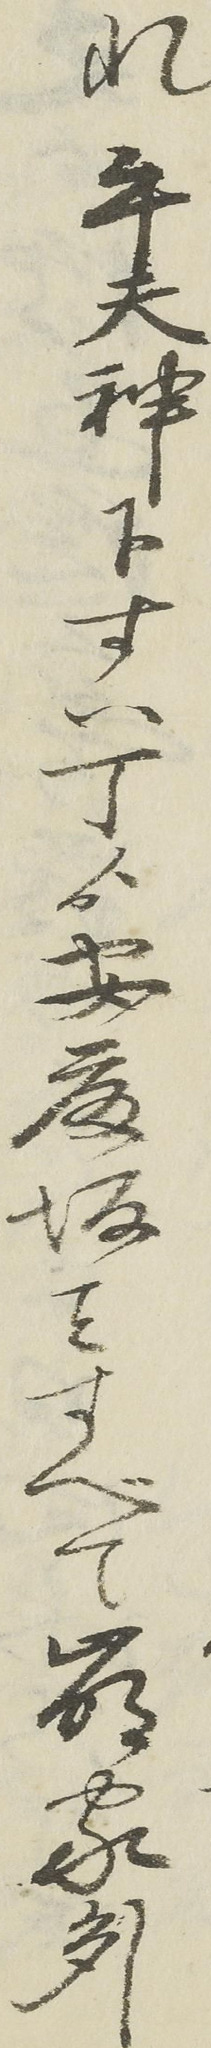れ牛天神下すは丁ゟ安藤坂ことすべて崩家多し

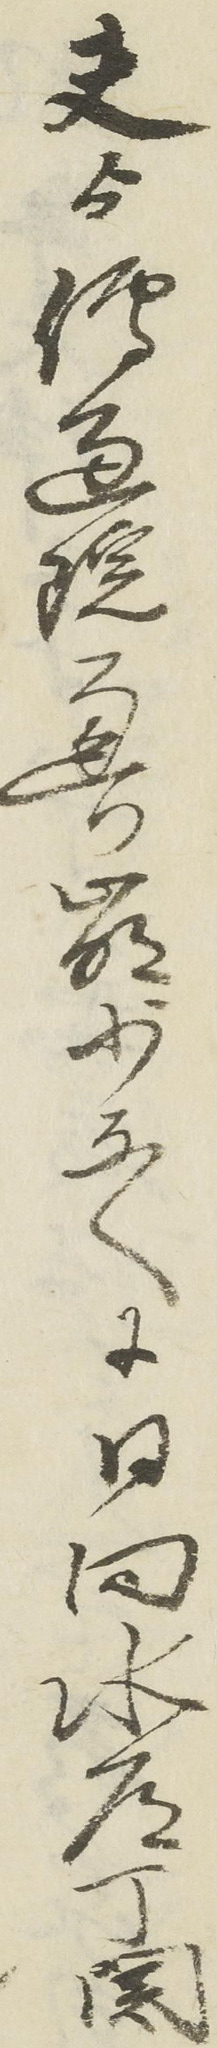夫ゟ傳通院通り崩少なくに日向水道丁関
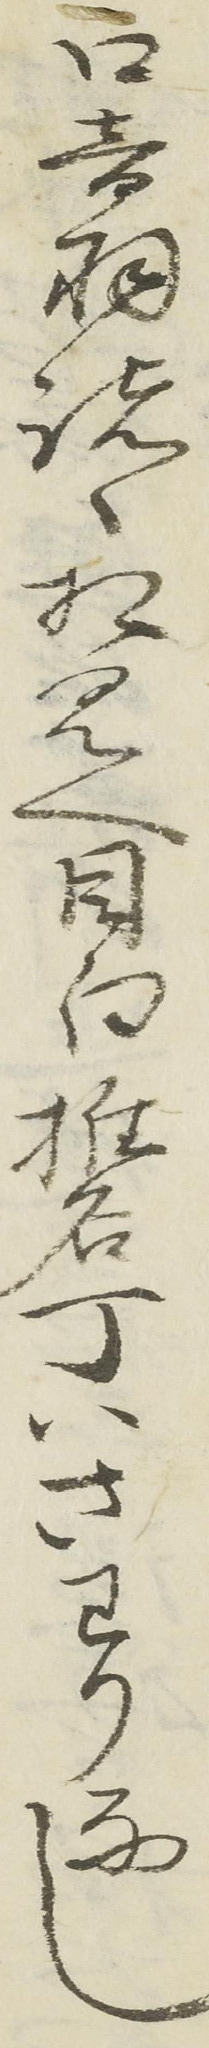口音羽諸〻相見へ目白椎名丁ハさわりなし
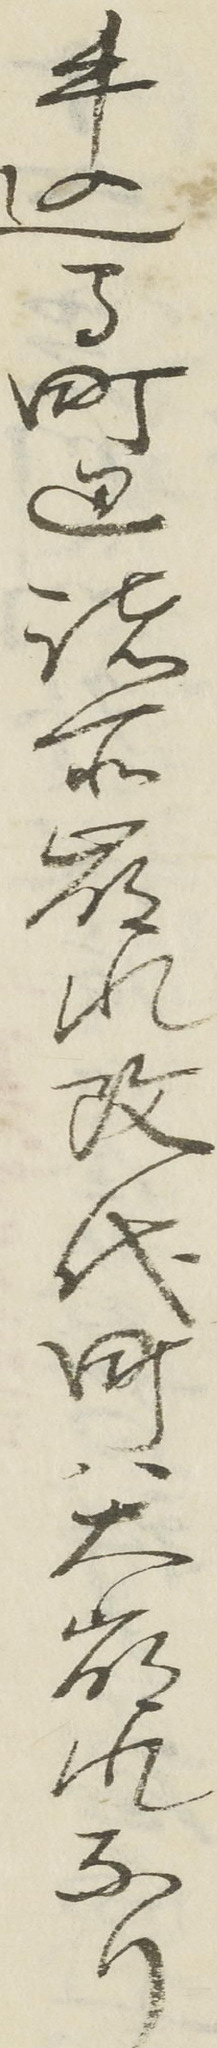牛込馬町辺諸所崩れ改代町ハ大崩れなり
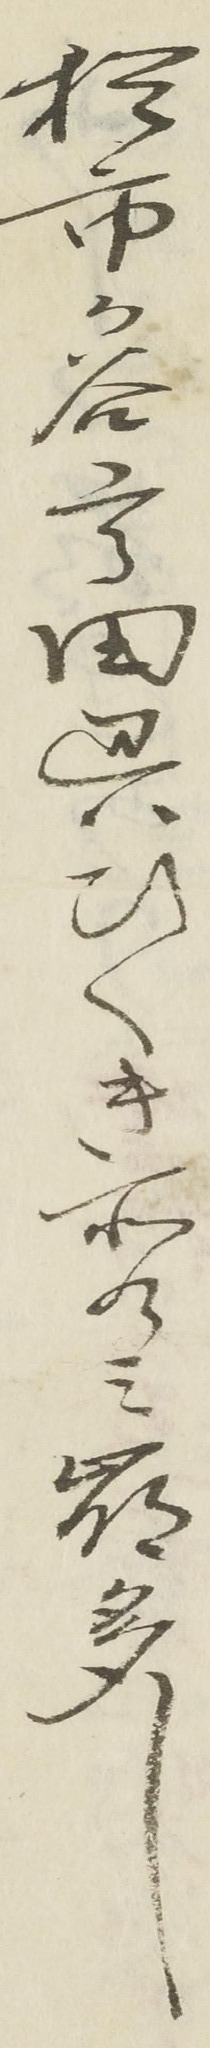猶市ヶ谷高田辺ハひくき所のミ崩多し
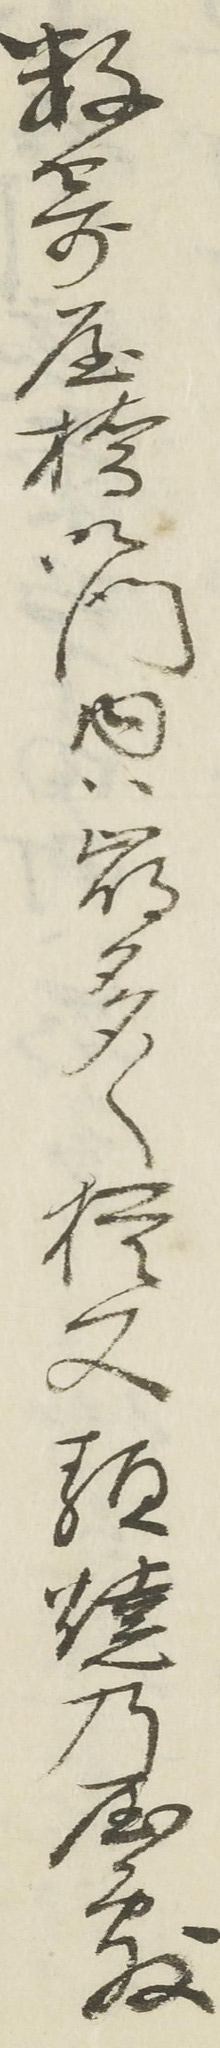数寄屋橋御門内ハ崩多く猶又類焼の屋敷
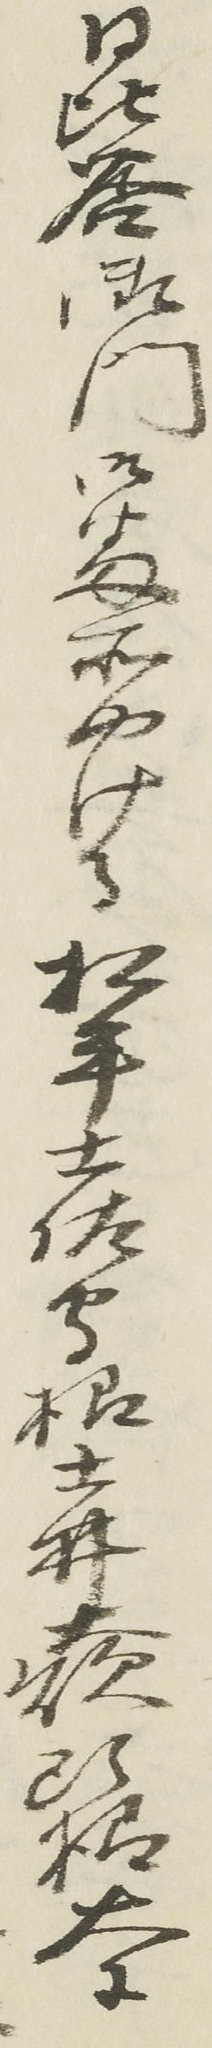日比谷御門御番所やける松平土佐守様土井大炊頭様大に
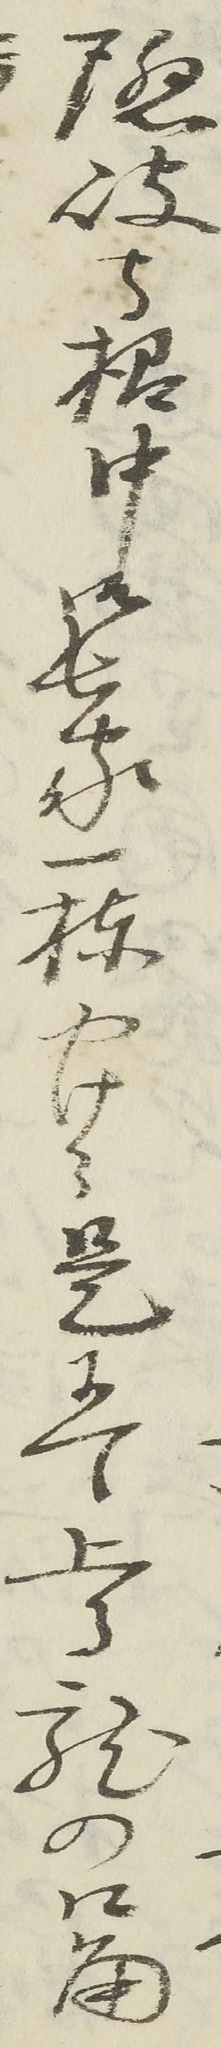隠岐守様中御長屋一棟やける是まて上る龍の口角
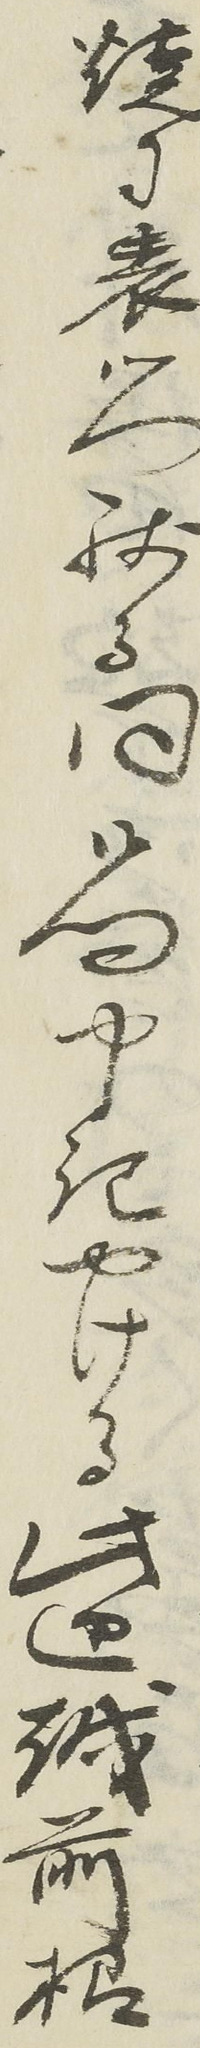焼る表御門残る同御向やしきやける此辺越前様
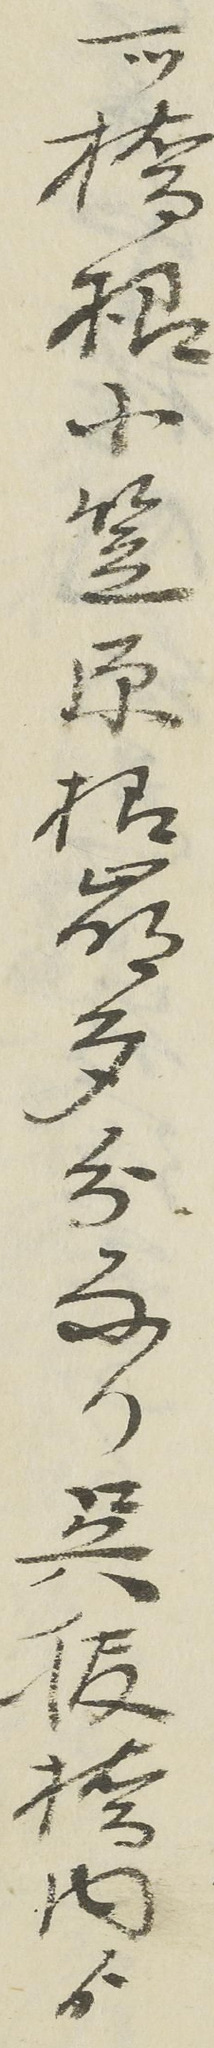一ツ橋様小笠原様崩多分なり呉服橋内ゟ

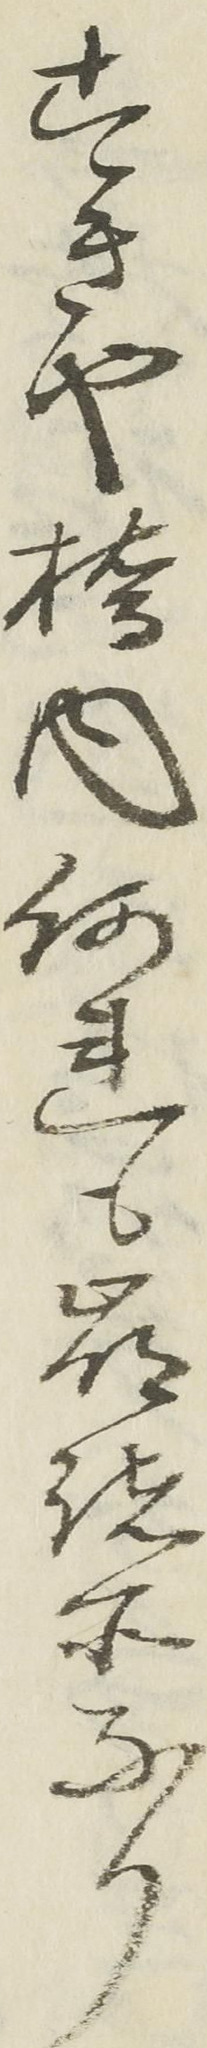すきや橋内何れも崩諸所なり
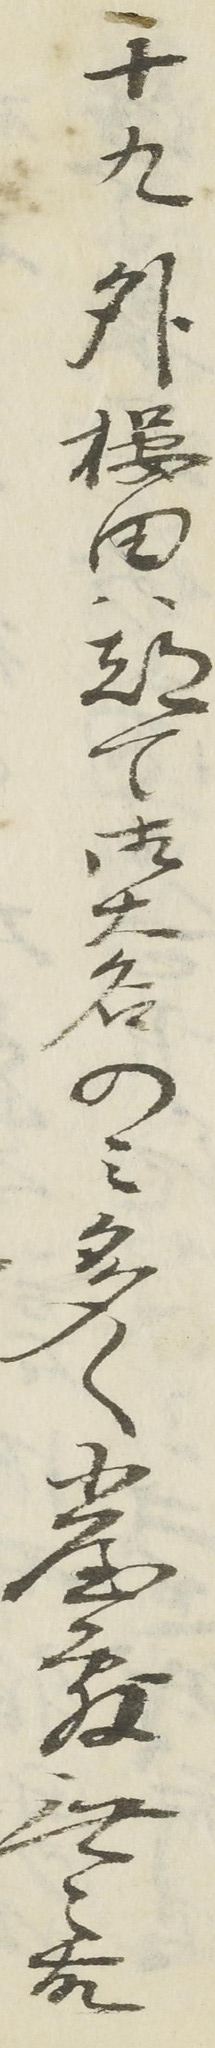十九外桜田ハ都而御大名のミ多く小屋敷無之故
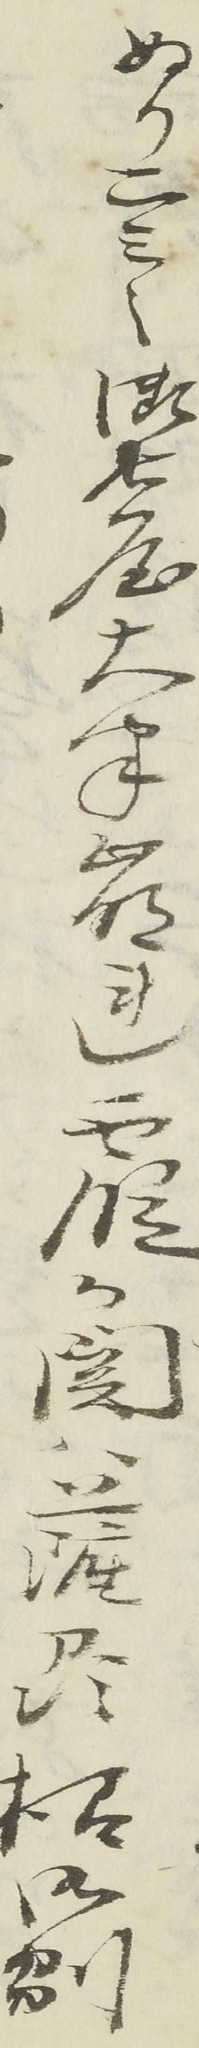ぬりこミ之御長屋大半崩れ霞か関ハ薩州様御別
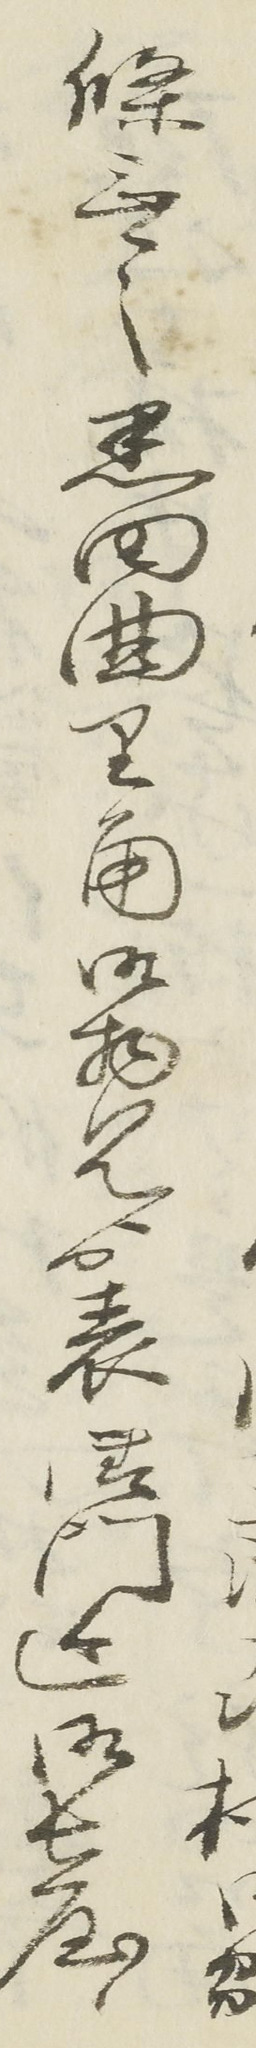條無之黒田曲わ角御物見ゟ表御門迄御長屋
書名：安政乙卯江戸大地震筆記　安政丙辰八月大阪大雷雨之記追加　安政三辰年七月松前辺大地震并八月大風雨記録
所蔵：東京大学地震研究所図書室 Earthquake Research Institute Library, The University of Tokyo, JAPAN
